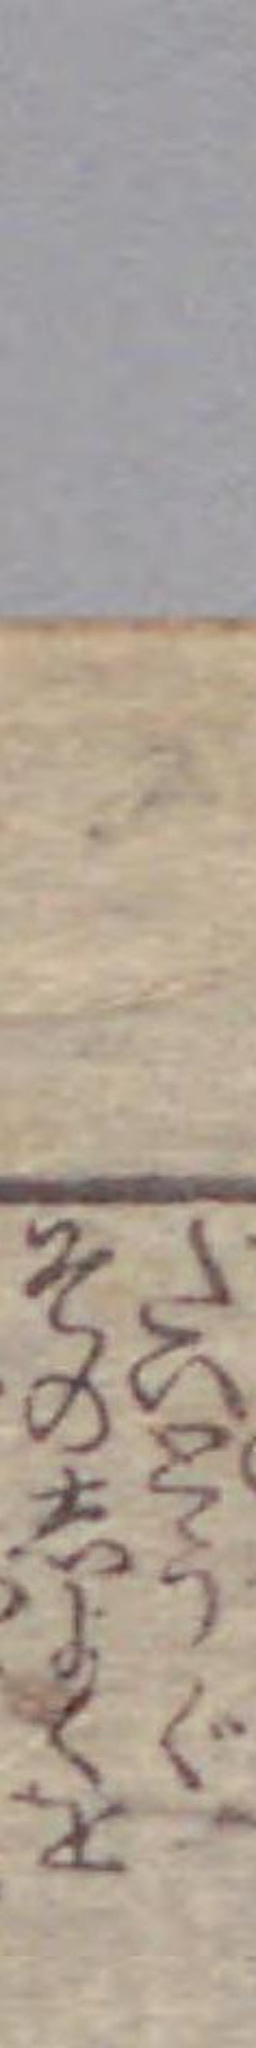そのしよくを
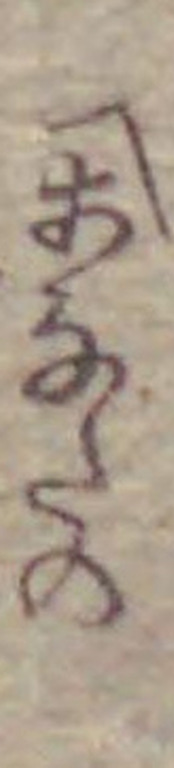〽あなたの
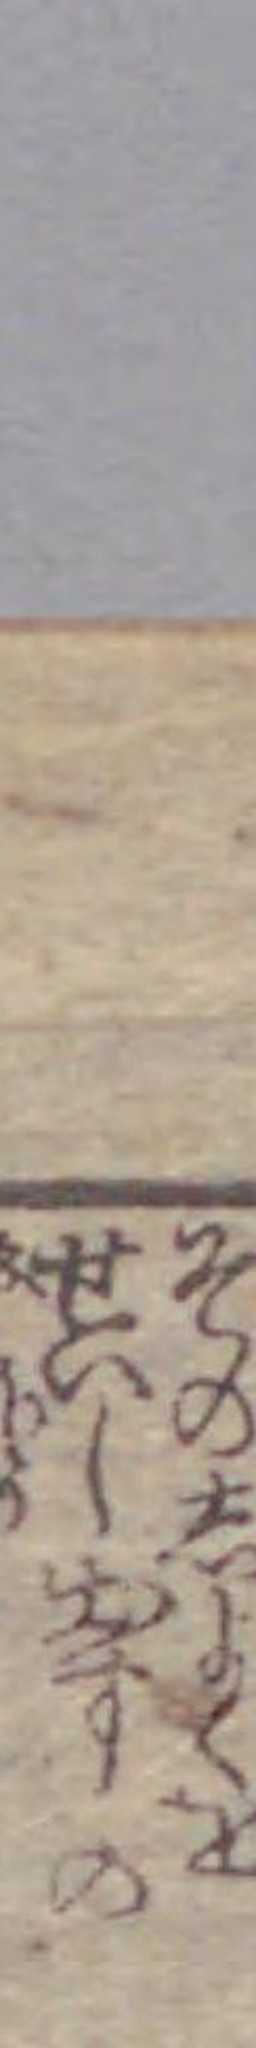せいし出すの
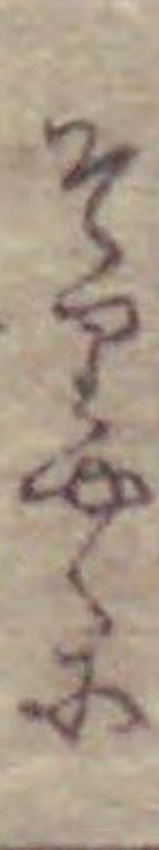そりやくに
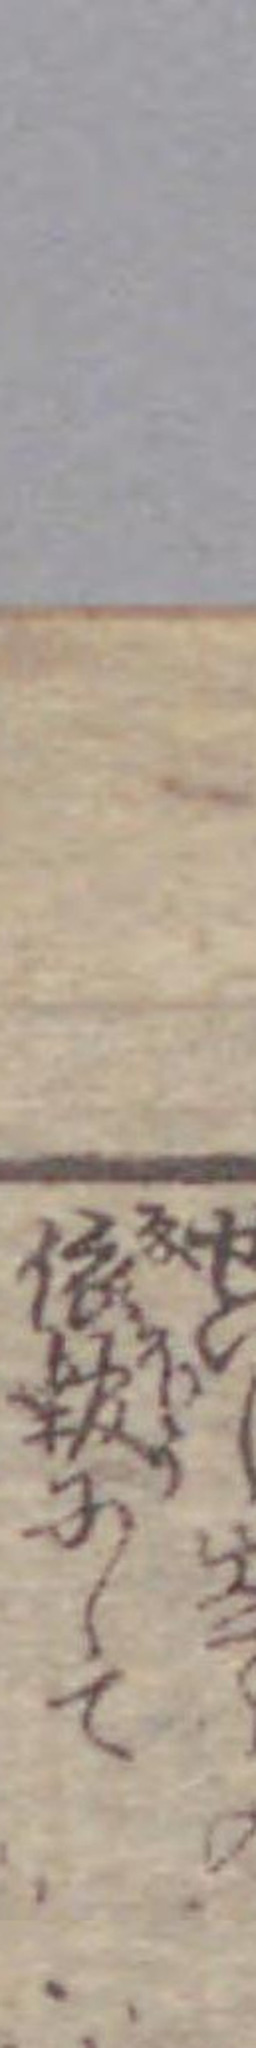依報にして
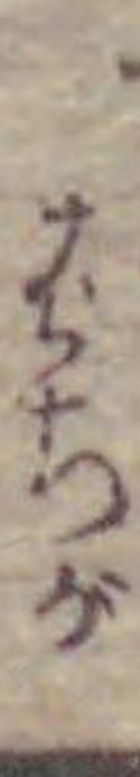ばちが
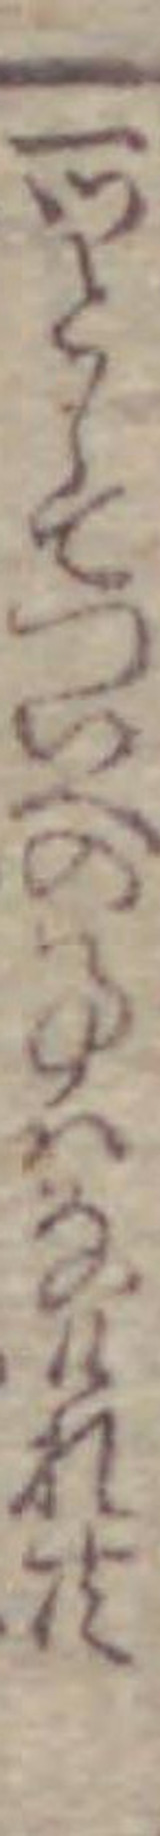一つとしてついへの事はなけれ共
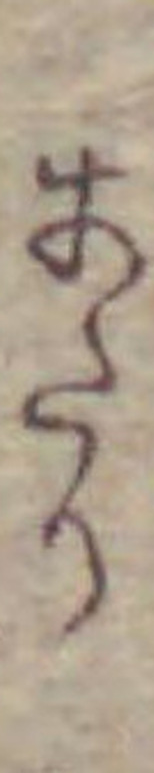あたり
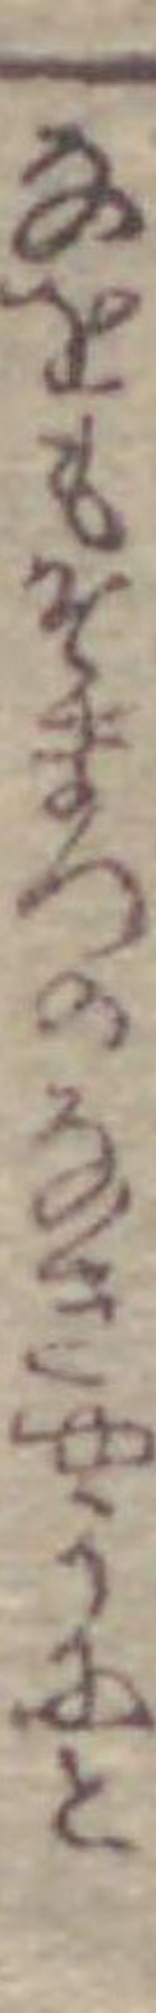なをもそまつのなきやうにと
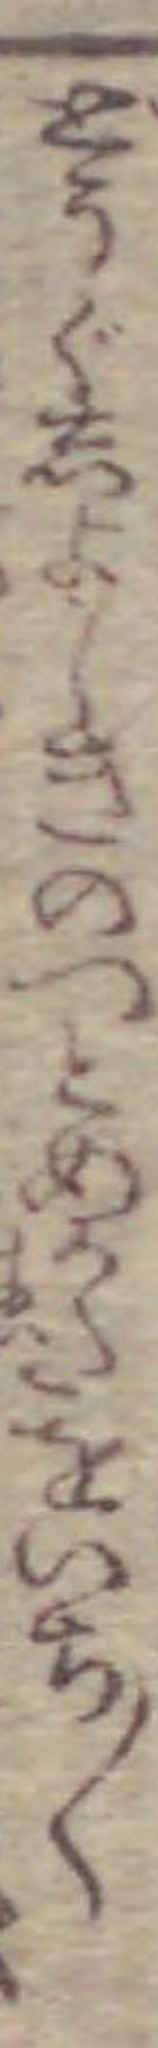どうぐしよくきのつとめかたをいち〳〵
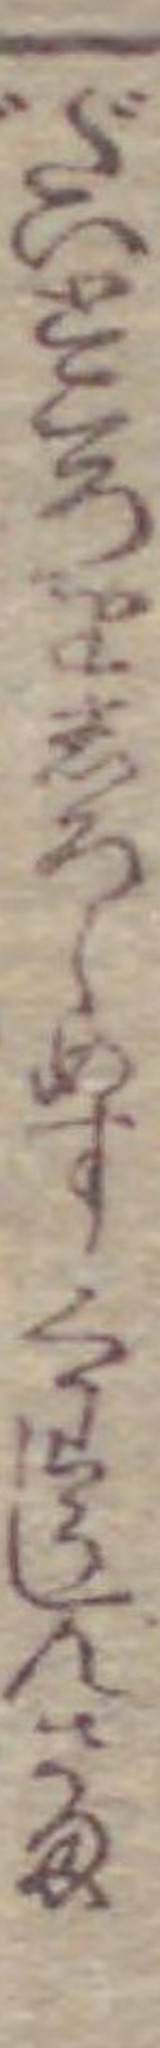だいところをしろしめすくわうしんさま
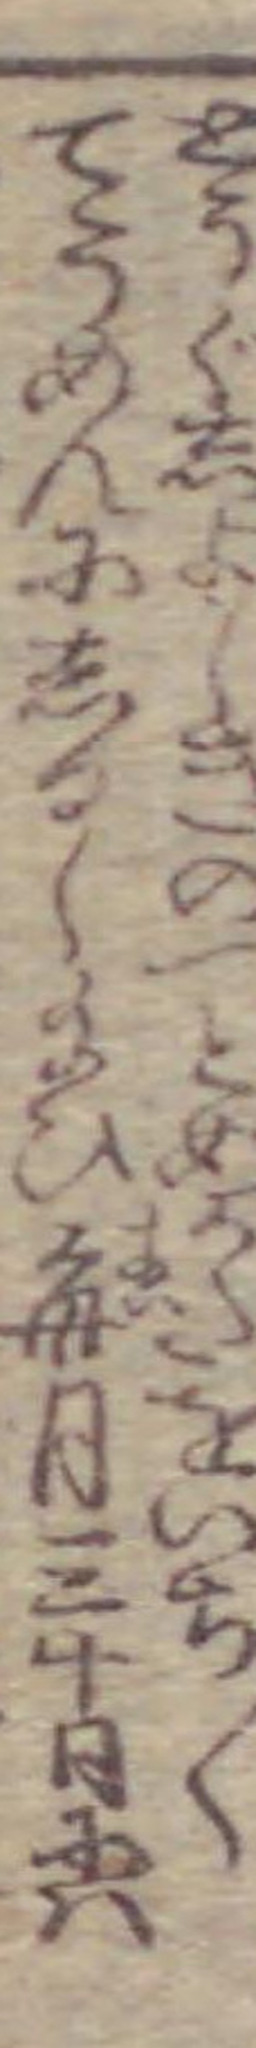てうめんにしるし給ひ毎月三十日には
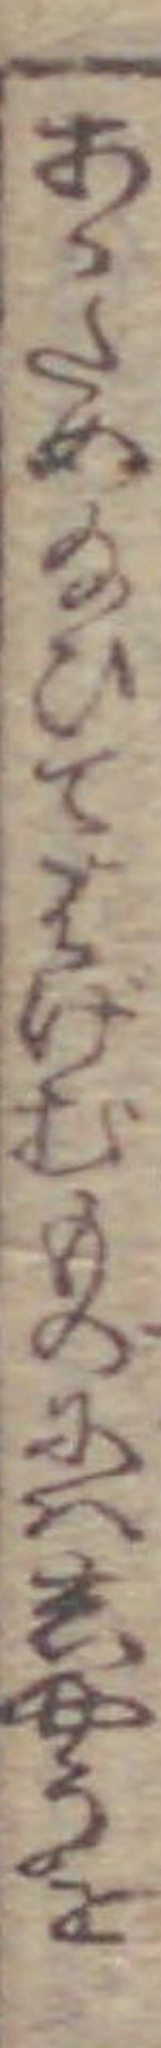あらため給ひてはげむものにはしやうを
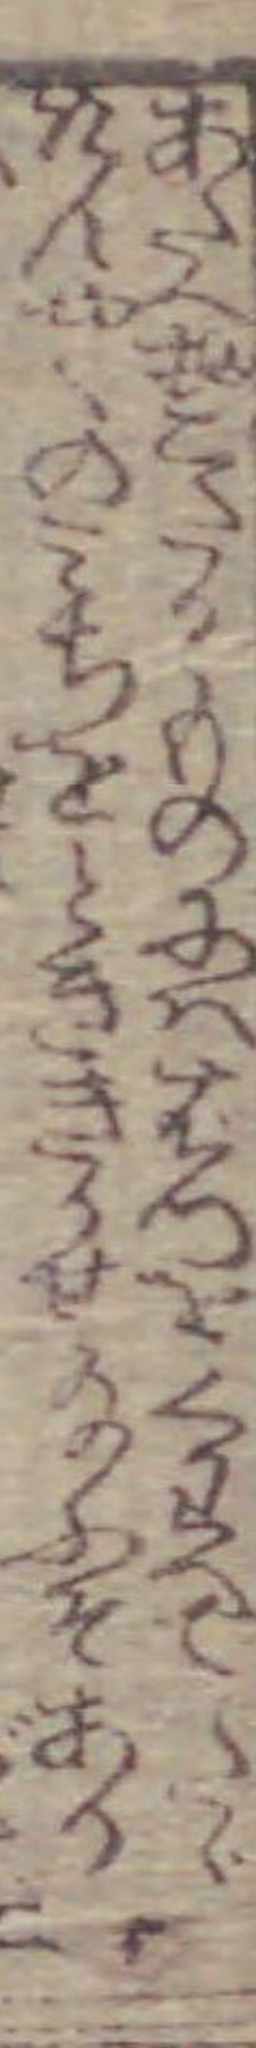けんやくのみちをときかせ給ふそあり
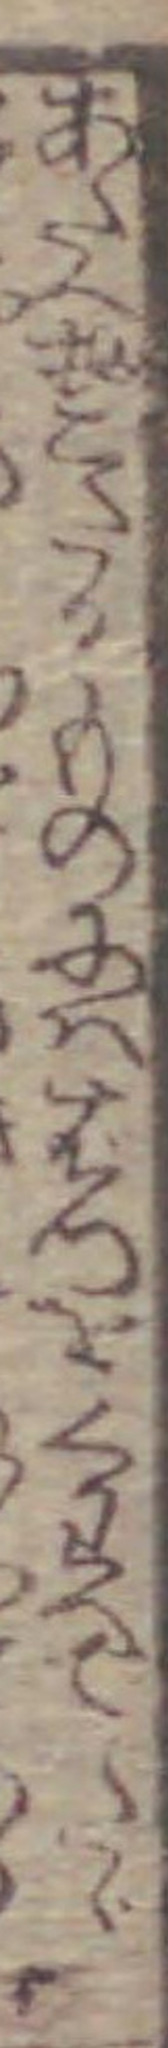あたへおこたるものにはばつをくわへてたゞ
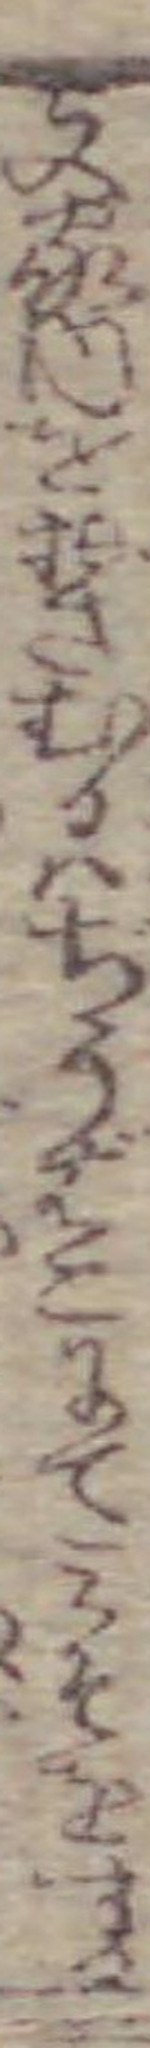又家内をおさむるはぢうばこにてみそをする
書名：【保留】万物小遣帳 : 2巻（国会）
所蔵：国立国会図書館 National Diet Library, JAPAN
